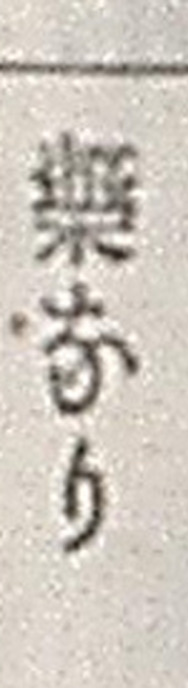薬なり
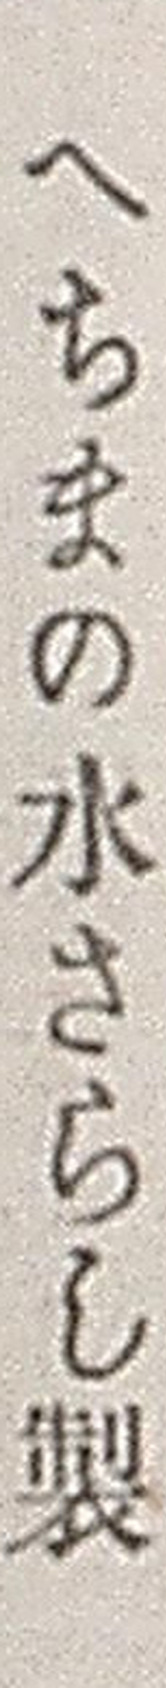へちまの水さらし製
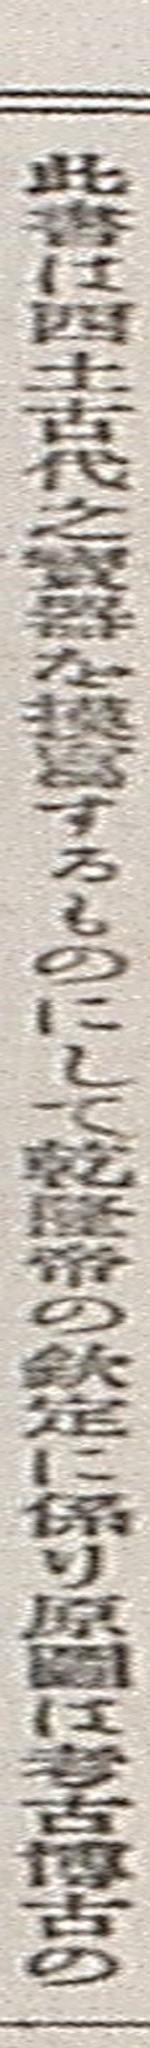此書は西土古代之実器を模写するものにして乾隆帝の欽定に係り原図は考古博古の
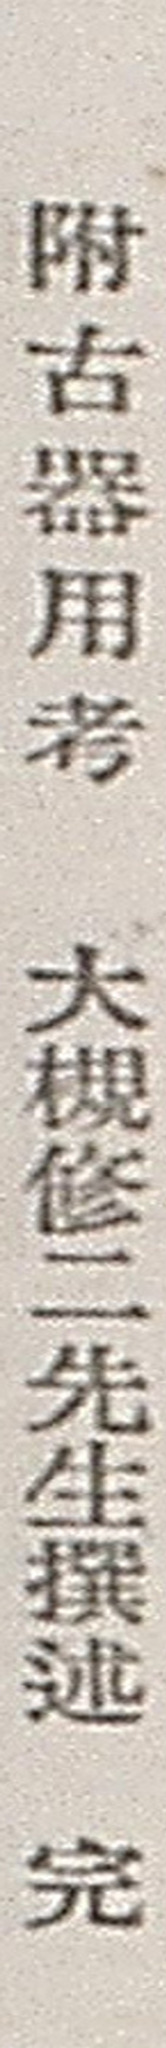附古器用考大槻修三先生撰述完
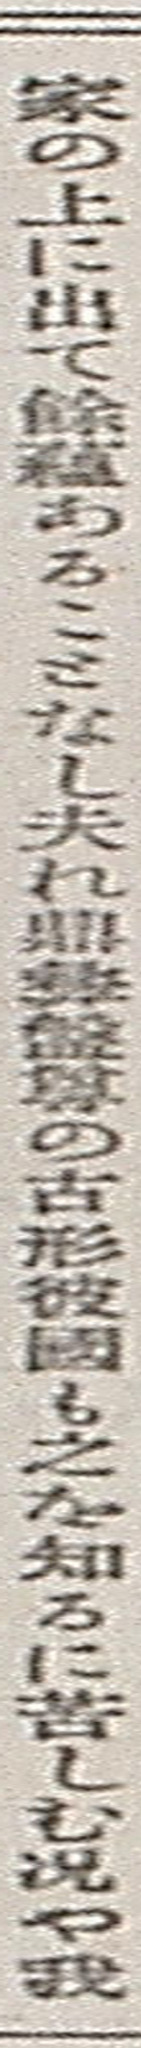家の上に出て余蘊あることなし夫れ鼎弊盤尊の古形彼国も之を知るに苦しむ況や我
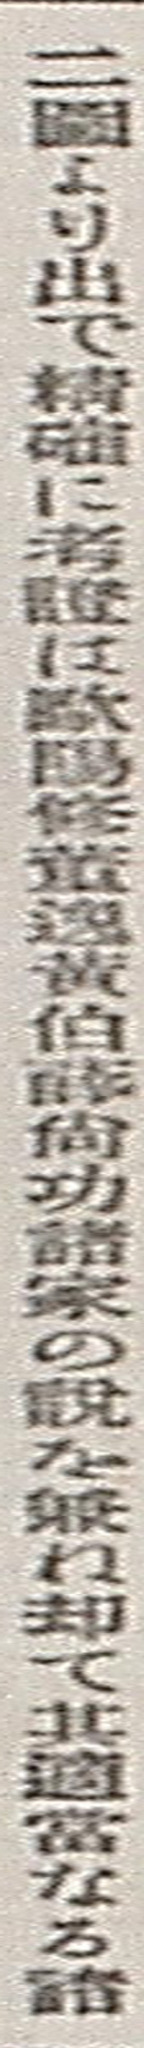二図より出で精確に考証は欧陽修菫逸黄伯薛尚功諸家の説を兼ね却て其適当なる諸
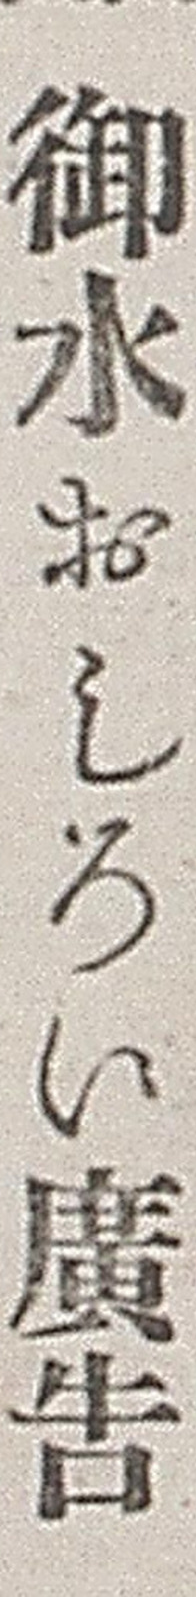御水おしろい広告
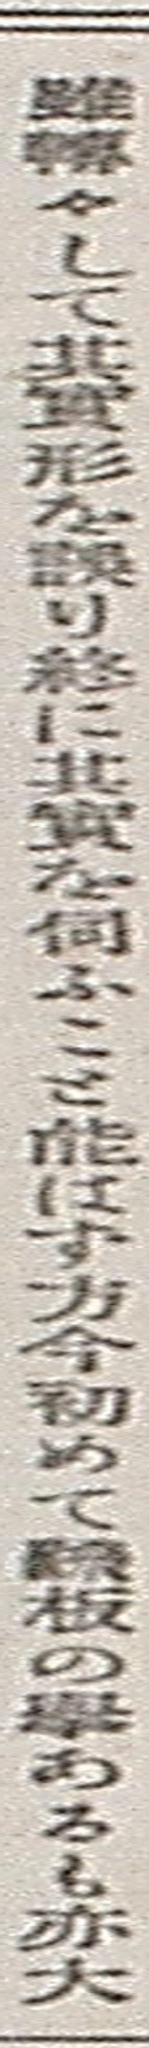雖転々して其実形を誤り終に其実を伺ふこと能はず方今初めて飜板の挙あるも亦大
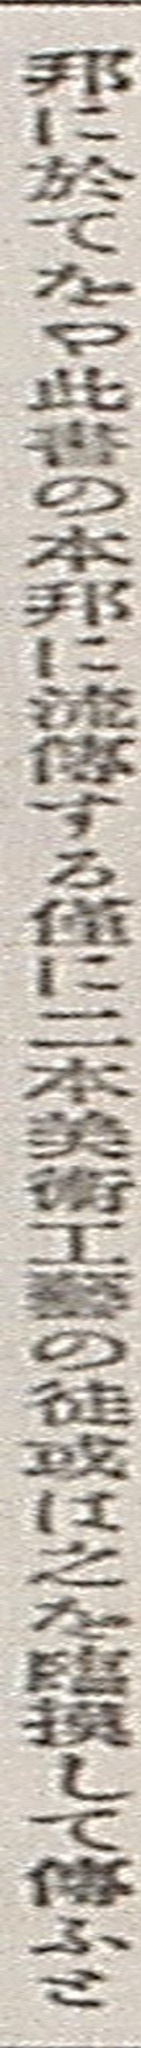邦に於てをや此書の本邦に流伝する侭に二本見術工芸の徒或は之を臨摸して伝ふと
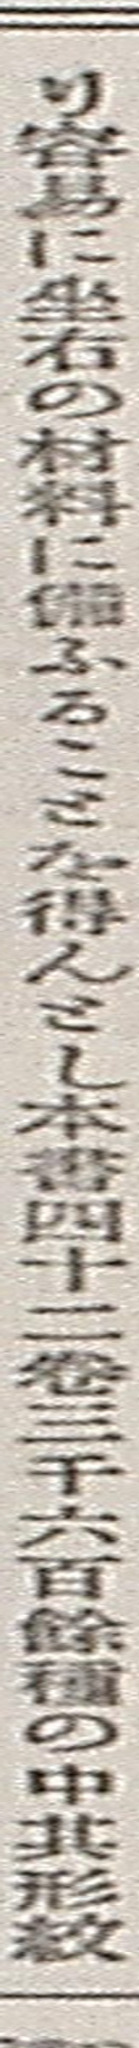り容易に坐右の材料に備ふることを得んとし本書四十二巻三千六百余種の中其形紋
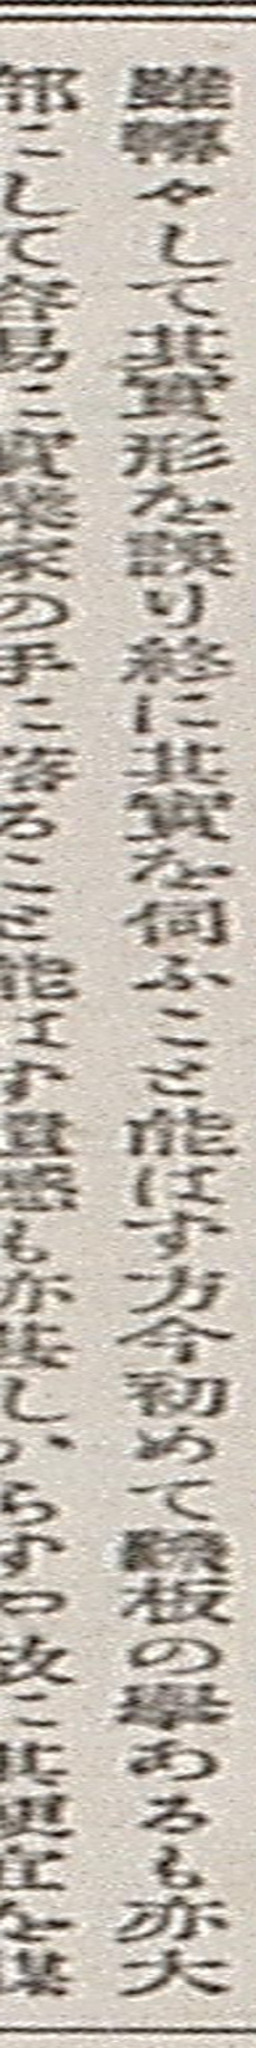部にして容易に実業家の手に落ること能はず遺憾も亦甚しからずや故に其便宜を謀
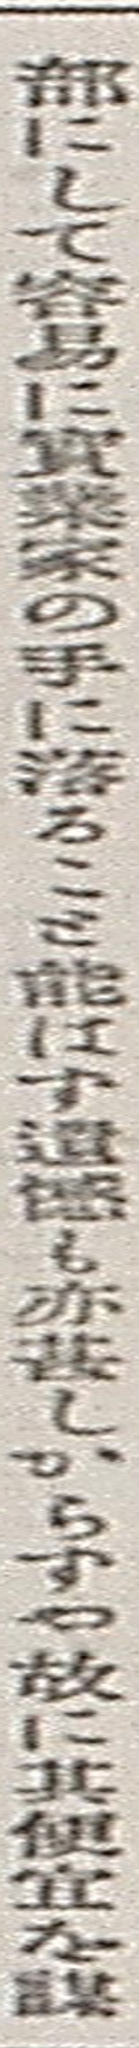部にして容易に実業家の手に落ること能はず遺憾も亦甚しからずや故に其便宜を謀
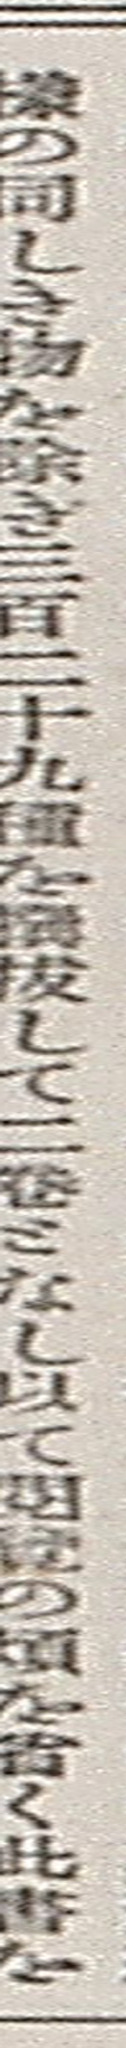様の同しき物を除き三百二十九種を撰抜して二巻となし以て閲覧の煩を省く此書を
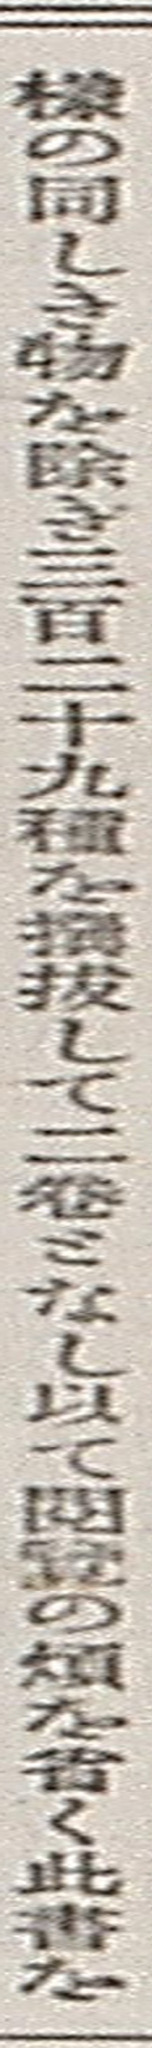様の同しき物を除き三百二十九種を撰抜して二巻となし以て閲覧の煩を省く此書を
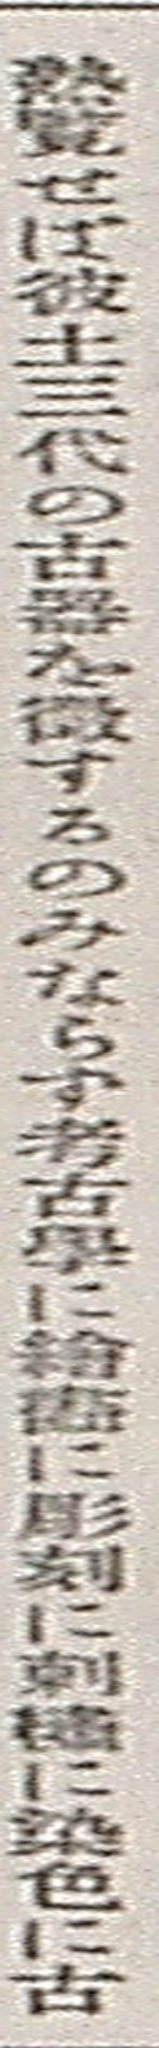熟覧せば彼土三代の古器を徴するのみならず考古学に絵画に彫刻に刺繍に染色に古
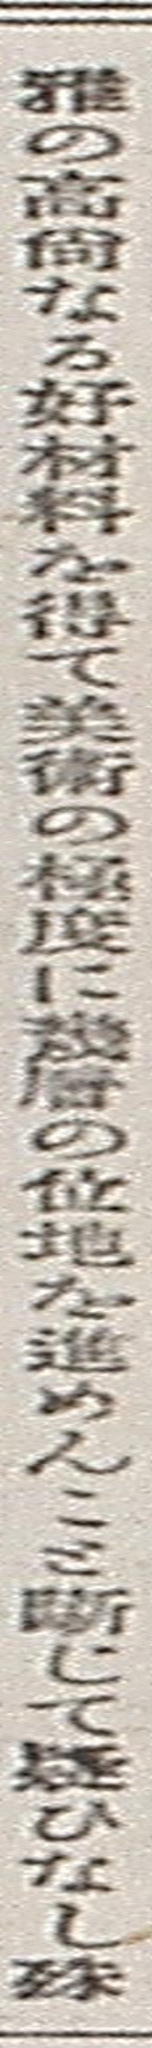雅の高尚なる好材料を得て美術の極度に幾層の位地を進めんこと断じて疑ひなし殊
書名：風俗畫報臨時増刊第百二十號　大海嘯被害録（下）
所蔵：東京大学地震研究所図書室 Earthquake Research Institute Library, The University of Tokyo, JAPAN
